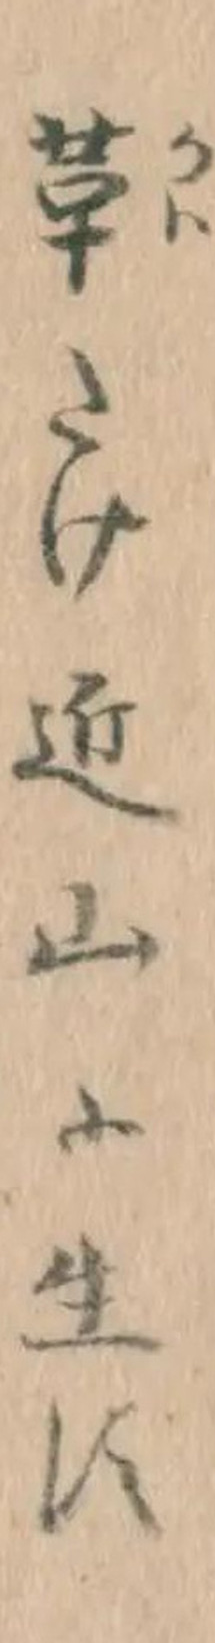革たけ近山に生す
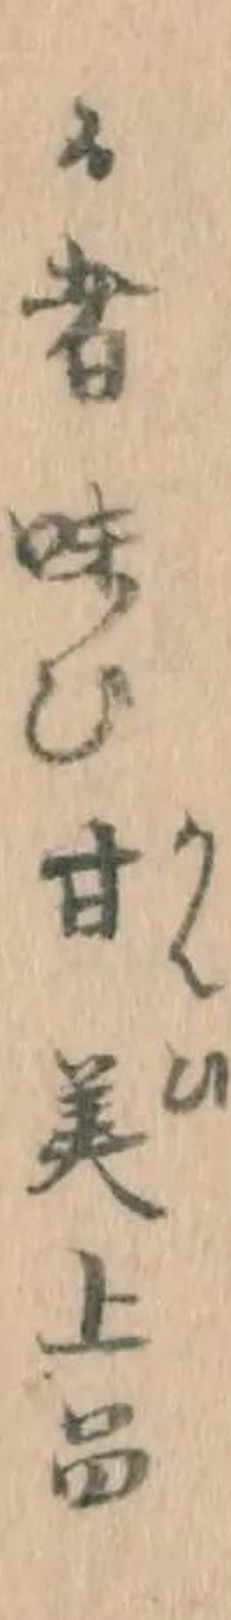る者味ひ甘美上品
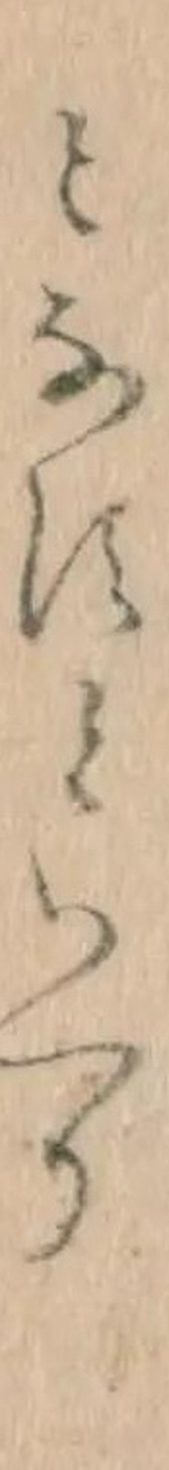となすといへり
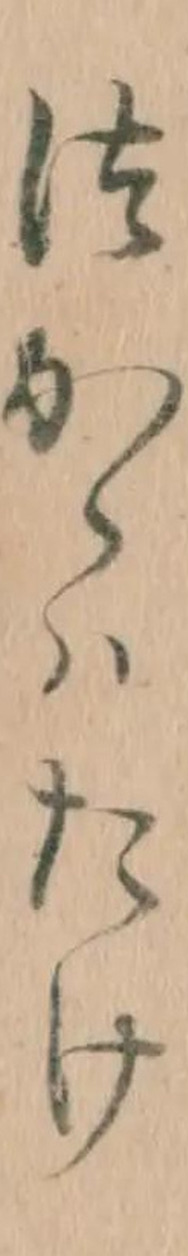つかゝはたけ
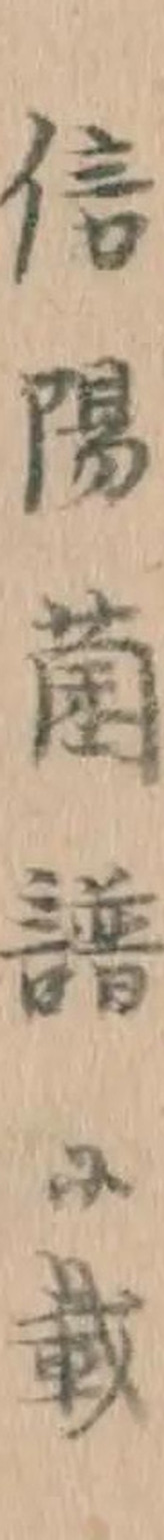信陽菌譜に載
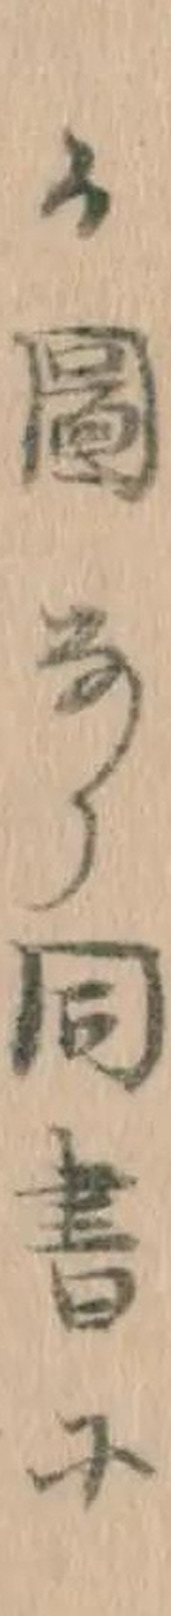る図なり同書に
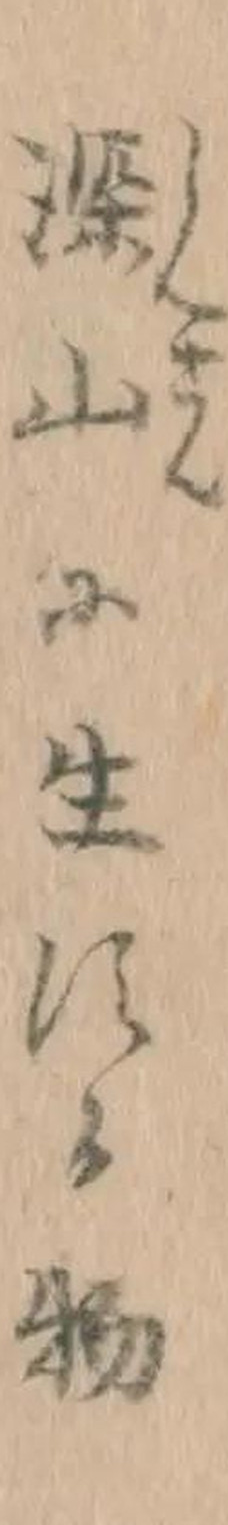深山に生する物
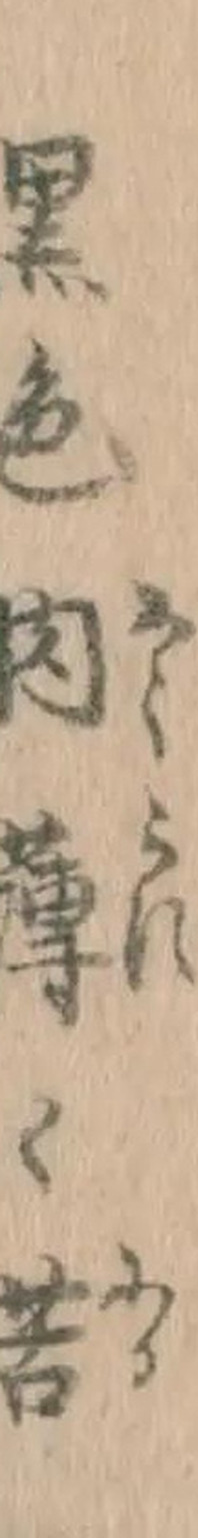黒色肉薄く苦
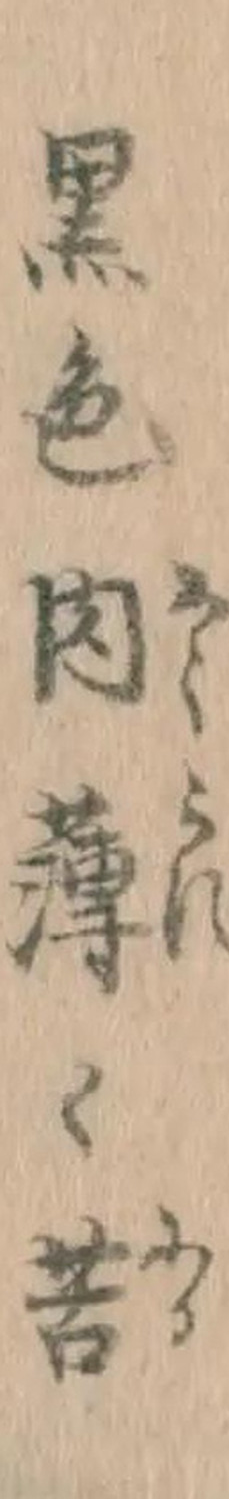黒色肉薄く苦
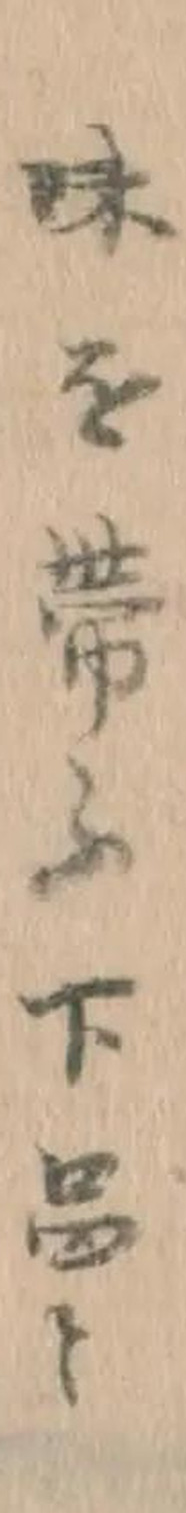味を帯ふ下品と
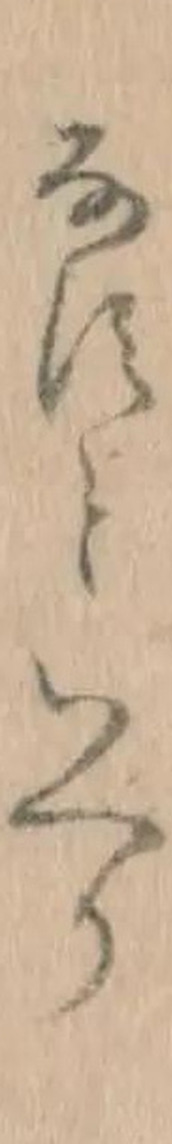なすといへり

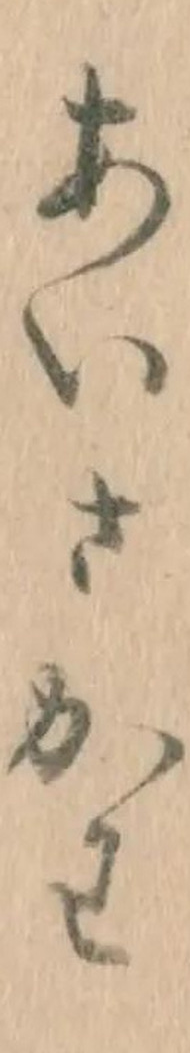あいさかわ
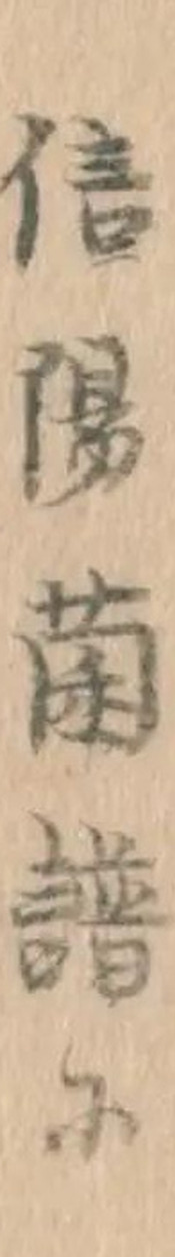信陽菌譜に
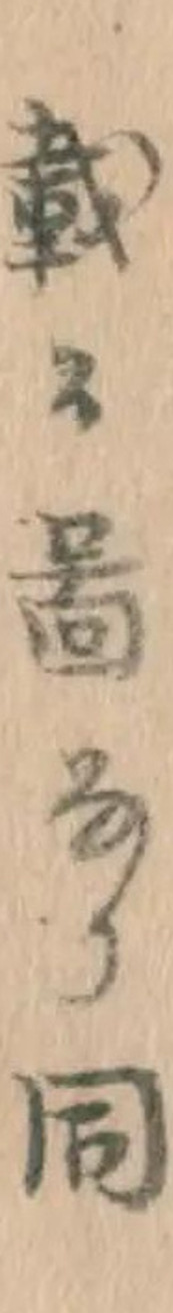載る図なり同
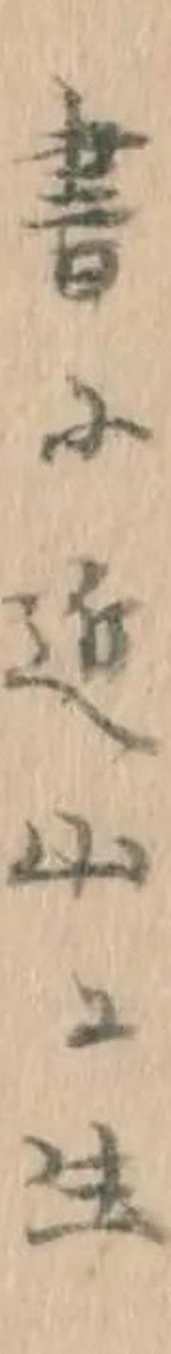書に近山に生
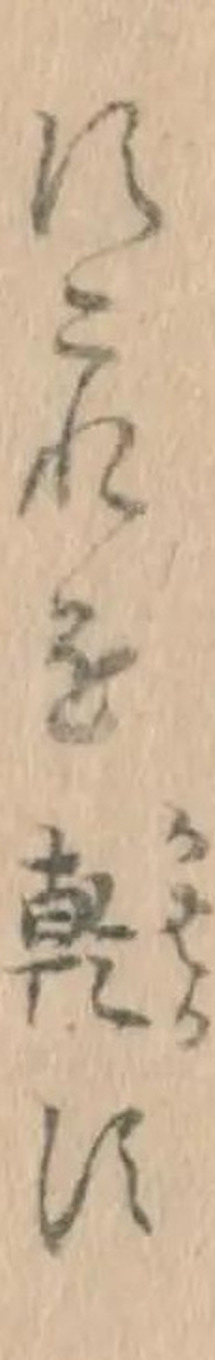すこれを乾す
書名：本草図譜. 巻55-57
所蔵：国立国会図書館 National Diet Library, JAPAN
